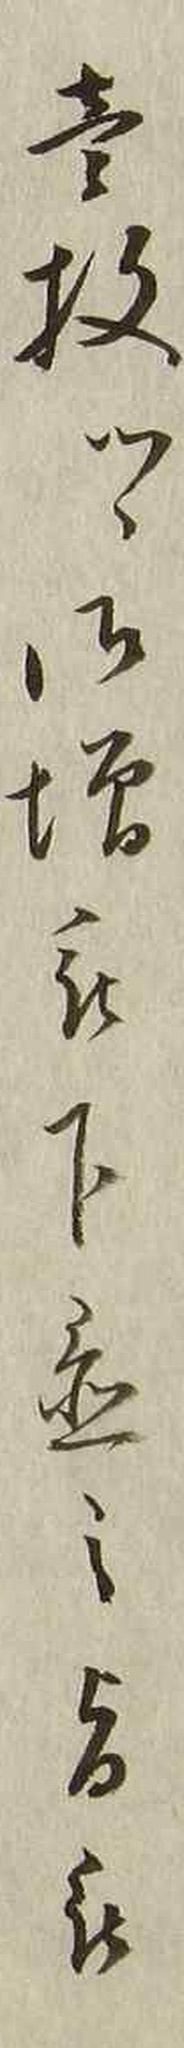壱枚ツヽ御増被下置之旨被
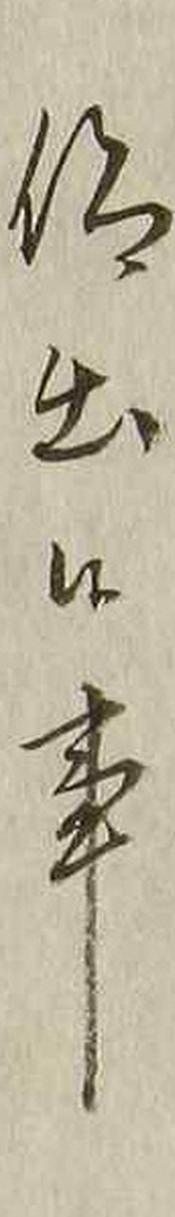仰出候事
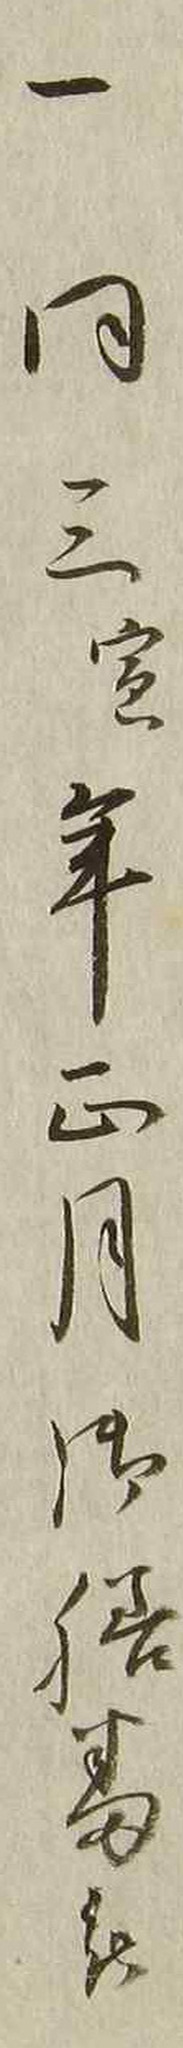一同三寅年正月御膳番被
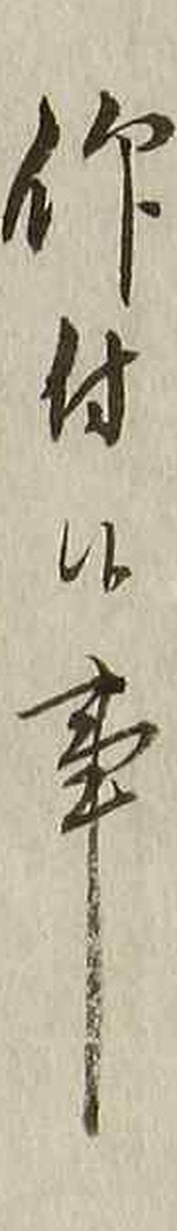仰付候事
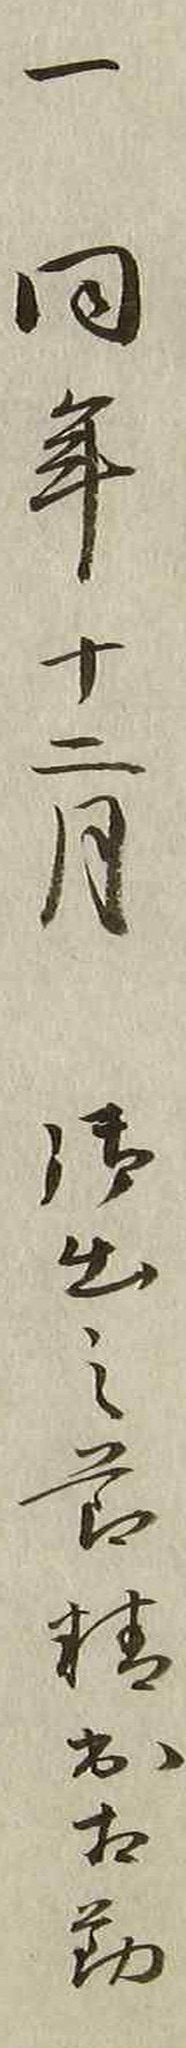一同年十二月御出之節精出相勤
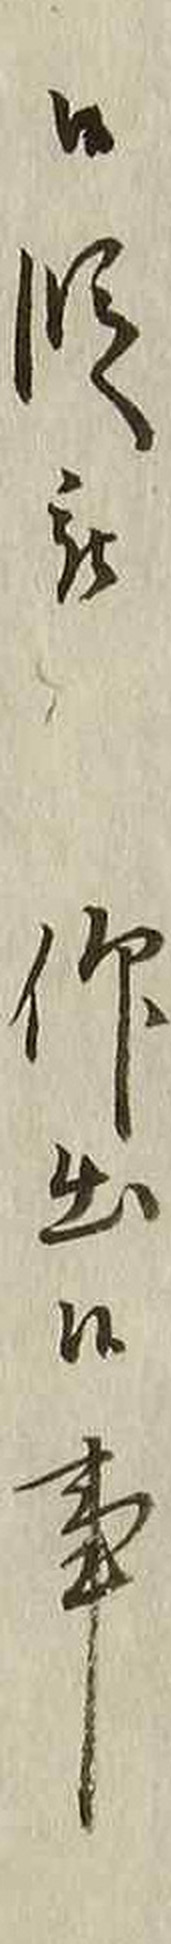候段被仰出候事
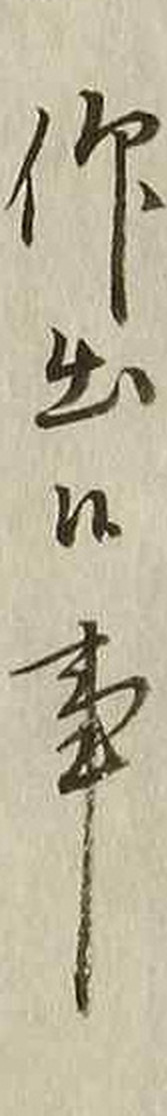仰出候事
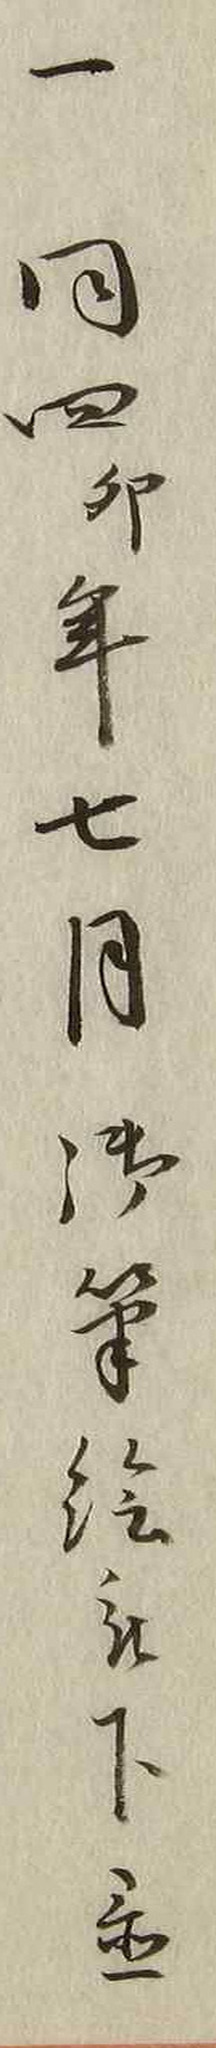一同四卯年七月御筆絵被下置
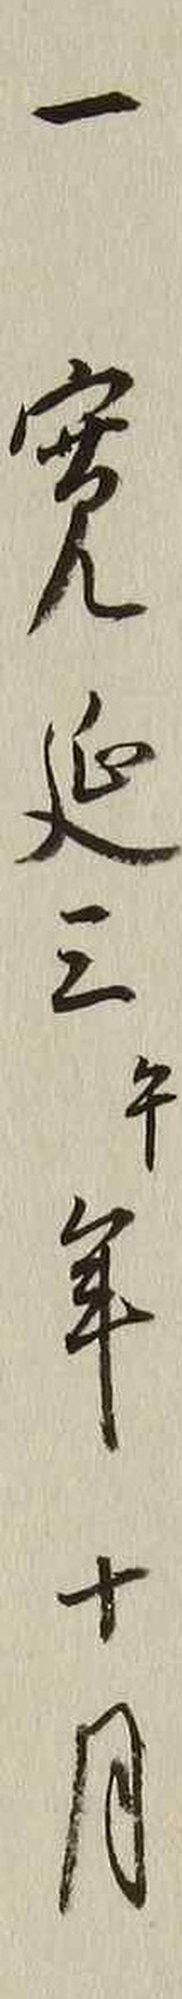一寛延三午年十月
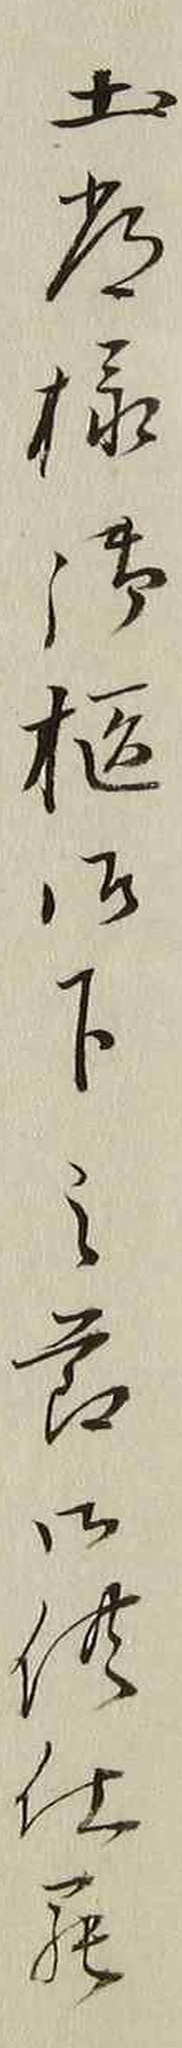土常様御柩御下之節御供仕罷
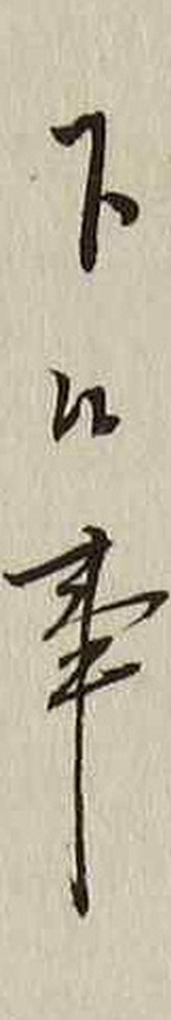下候事
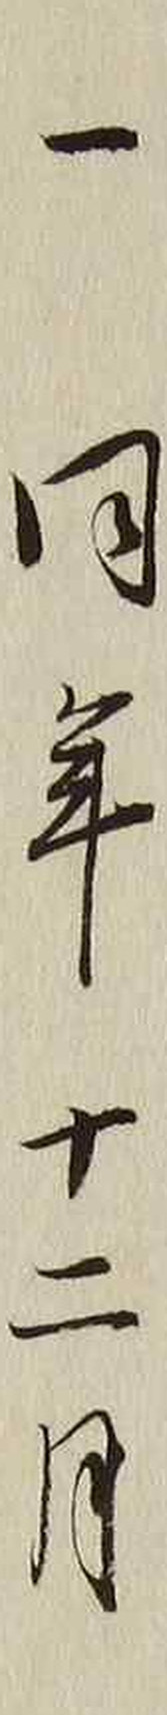一同年十二月
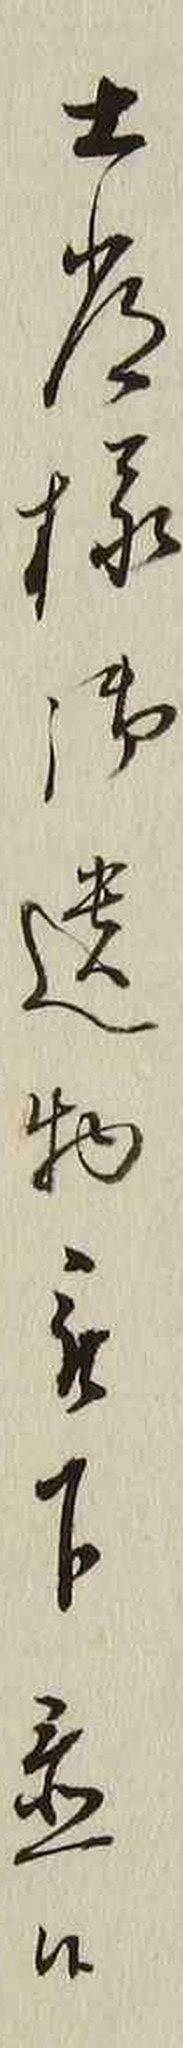土常様御遺物被下置候
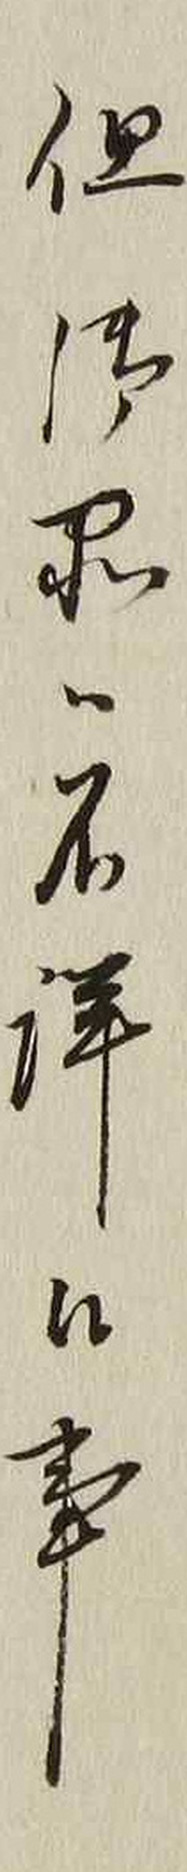但御品ハ不詳候事
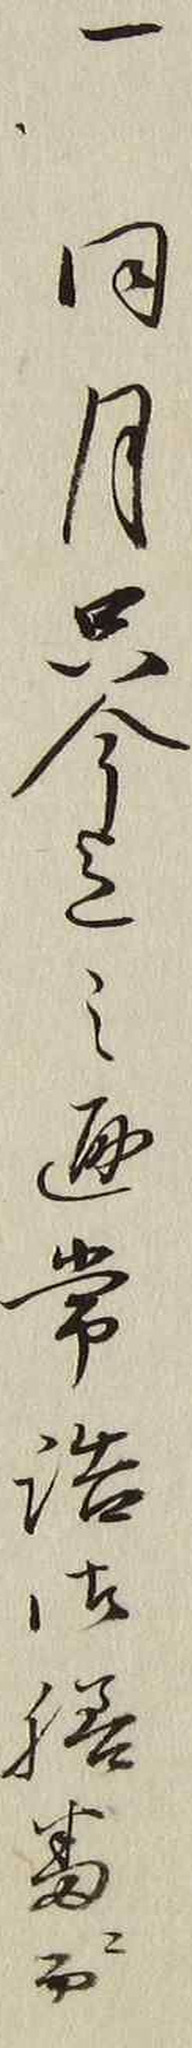一同月只今迄之通常詰御膳番ニ而
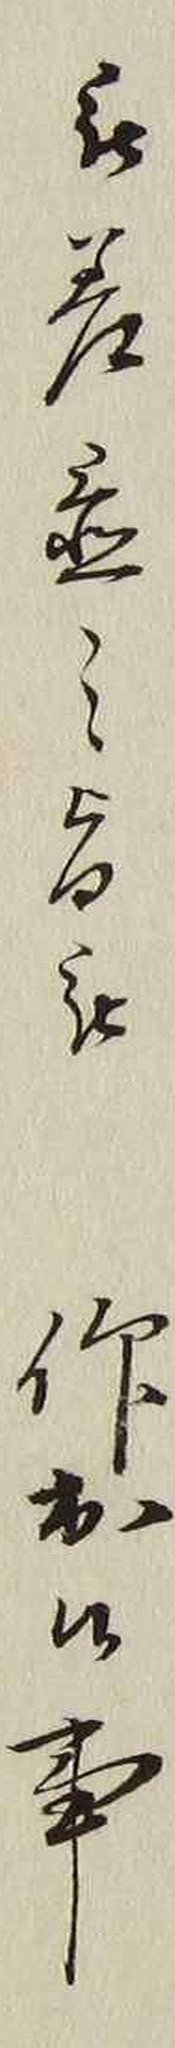被差置之旨被仰出候事
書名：諸士系譜　巻之22　い之部22
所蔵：会津若松市立会津図書館
